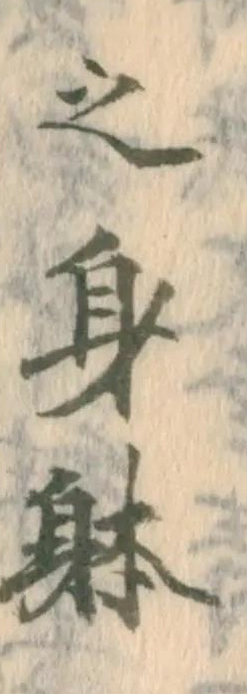之身体
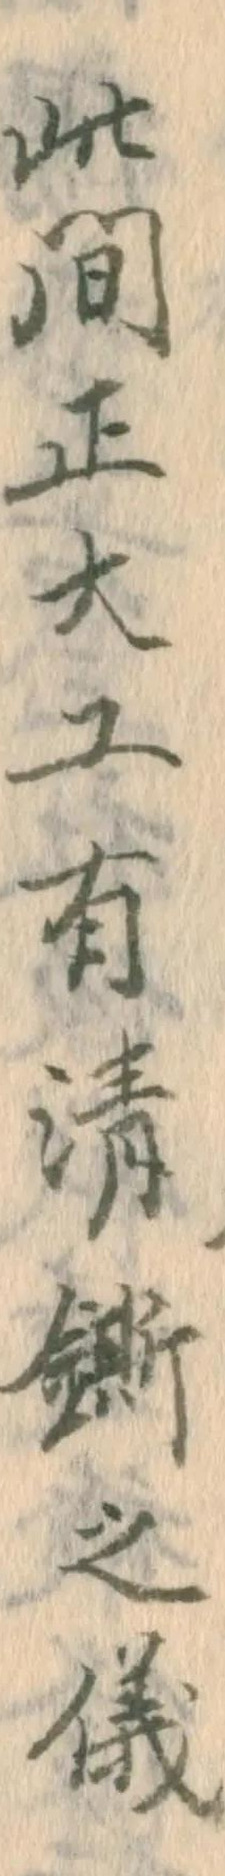此間正大工有清鐁之儀
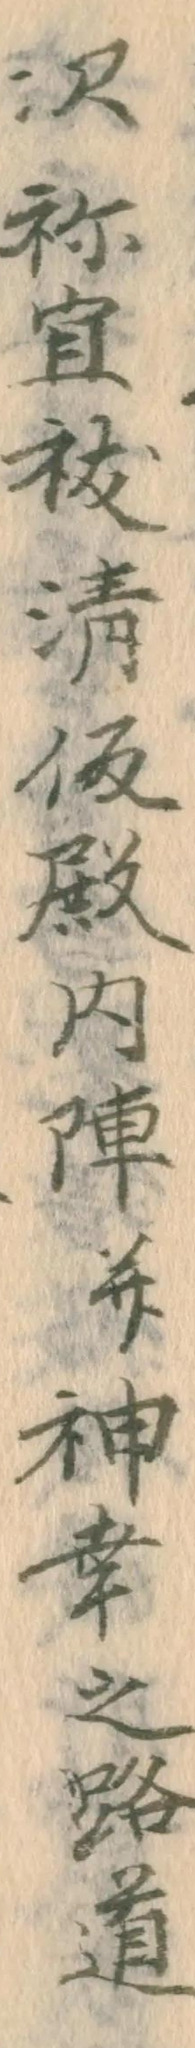次祢宜祓清仮殿内陣并神幸之路道
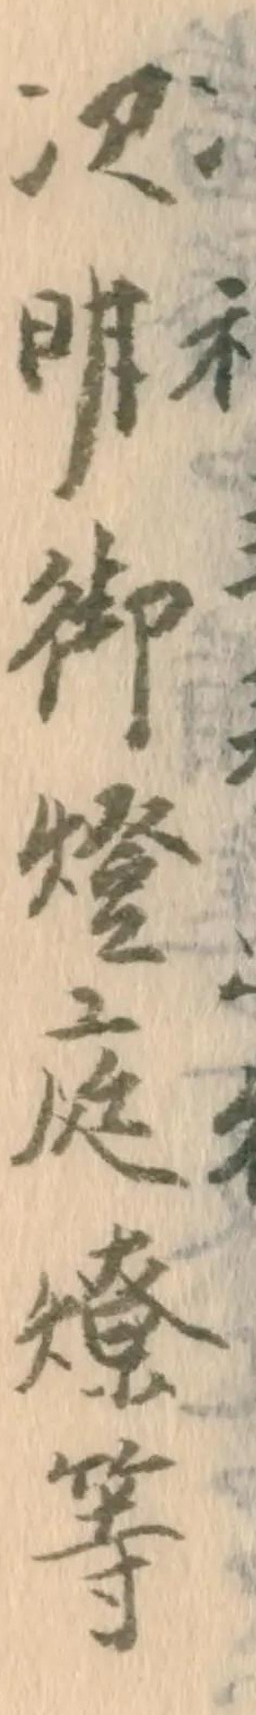次明御燈庭燎等
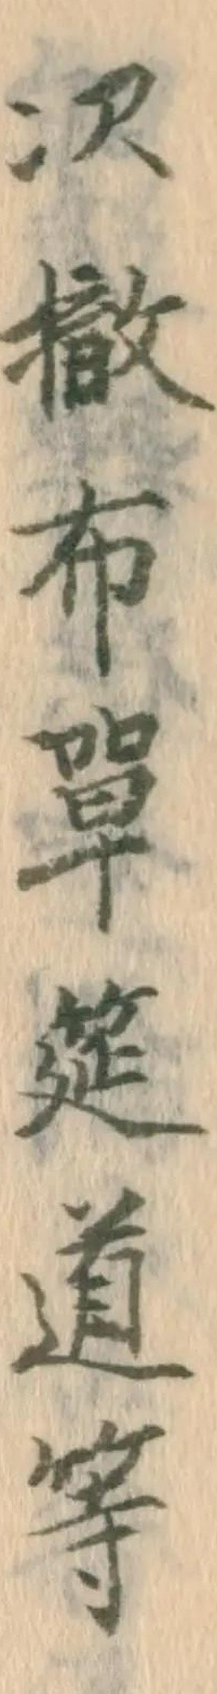次撤布単筵道等
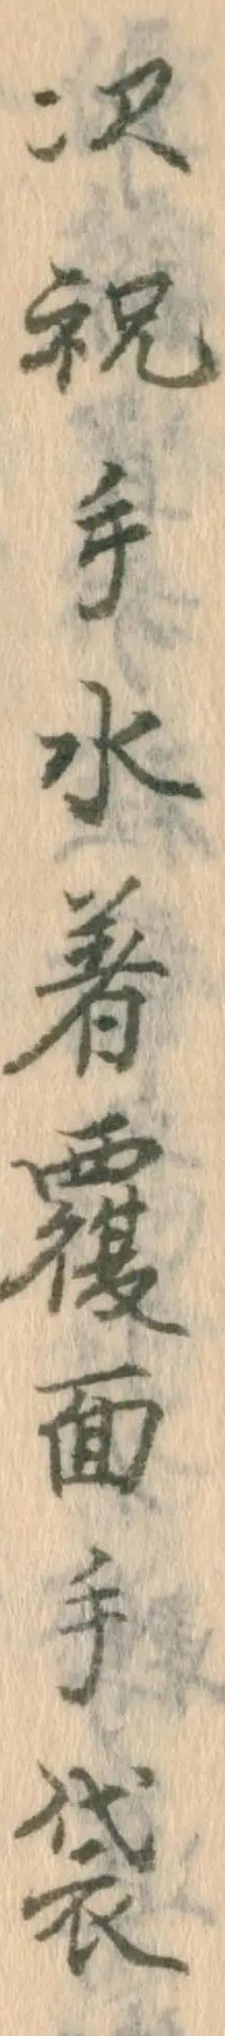次祝手水着覆面手袋
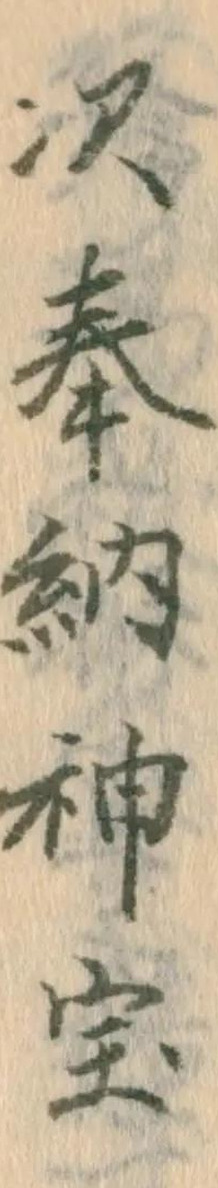次奉納神宝
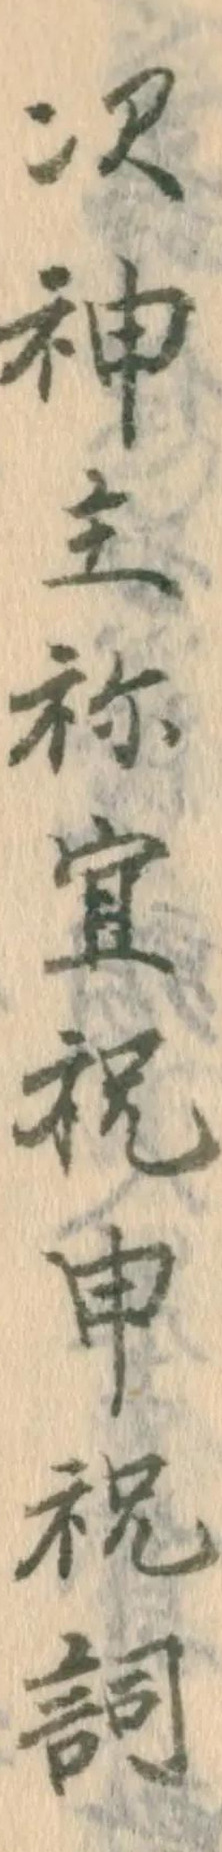次神主祢宜祝申祝詞
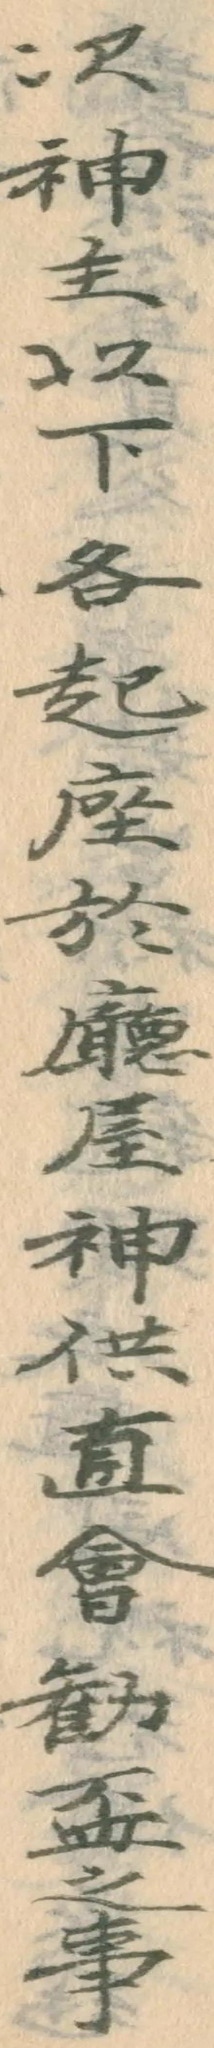次神主以下各起座於庁屋神供直会勧盃之事
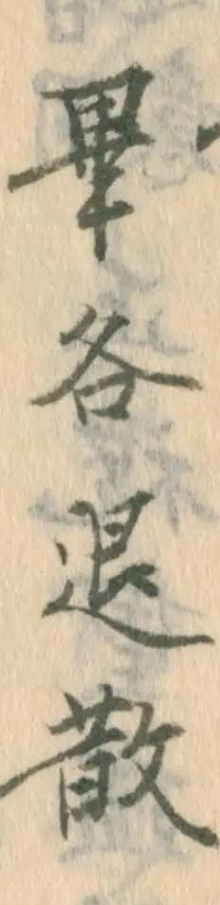畢各退散
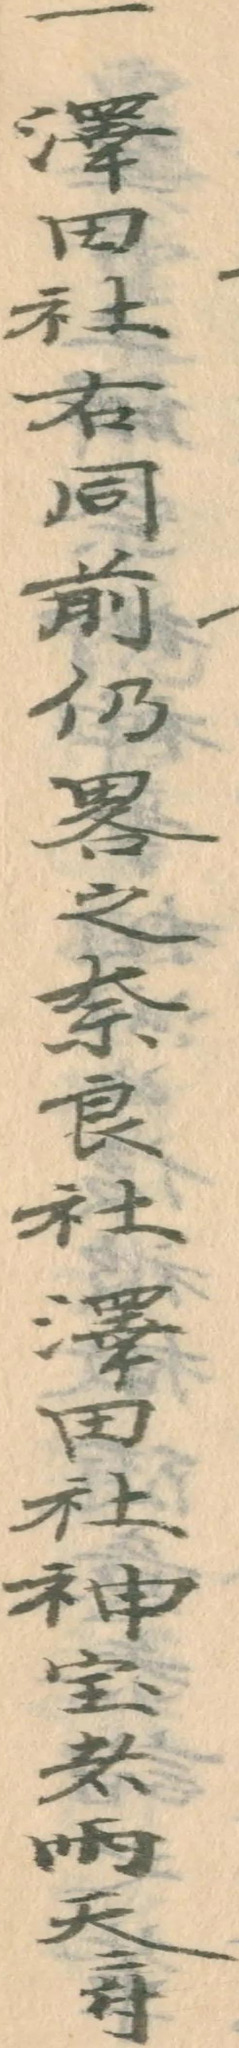一沢田社右同前仍略之奈良杜沢田杜神宝は雨天ニ付

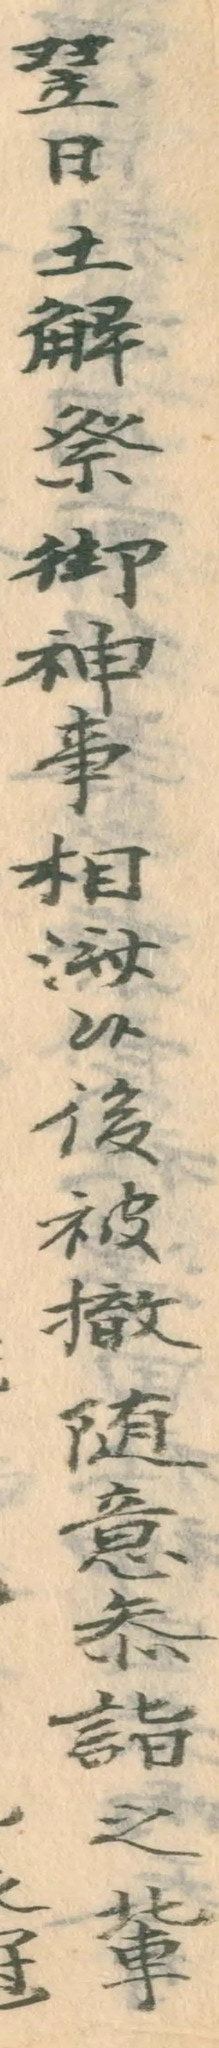翌日土解祭御神事相済候後被撤随意参詣之輩
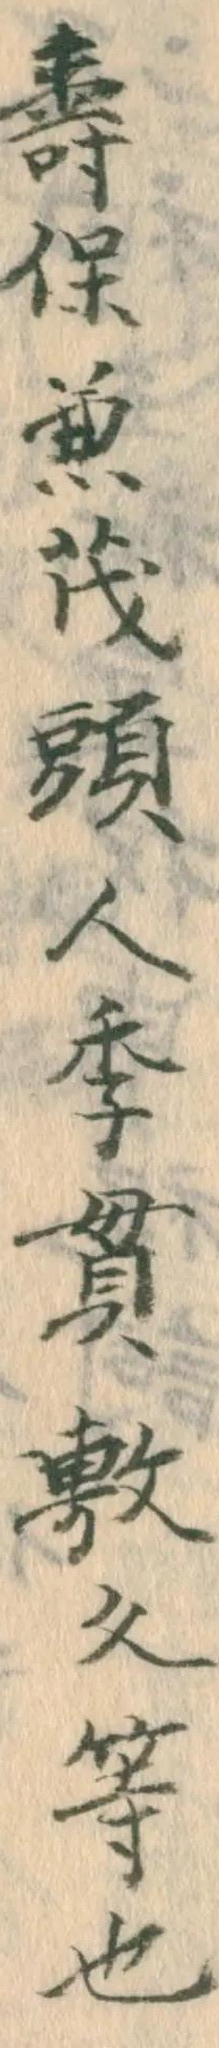寿保兼茂頭人季貫敷久等也
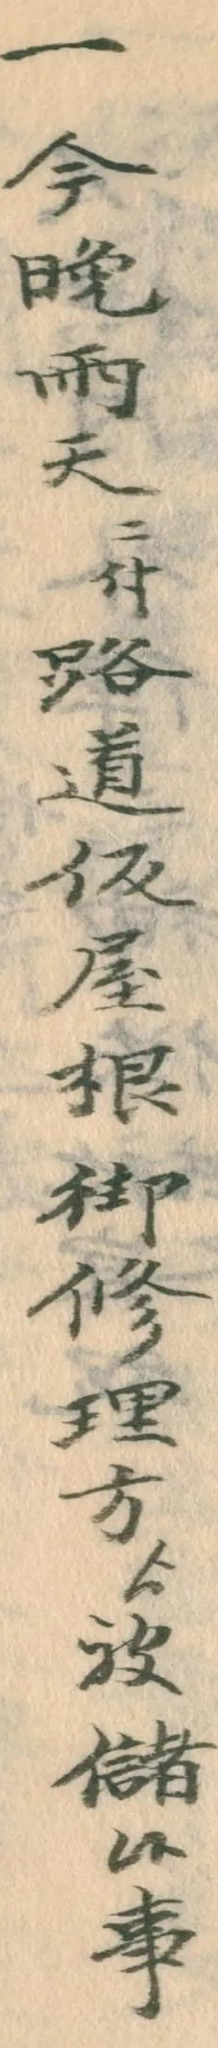一今晩雨天ニ付路道仮屋根御修理方ゟ被儲候事
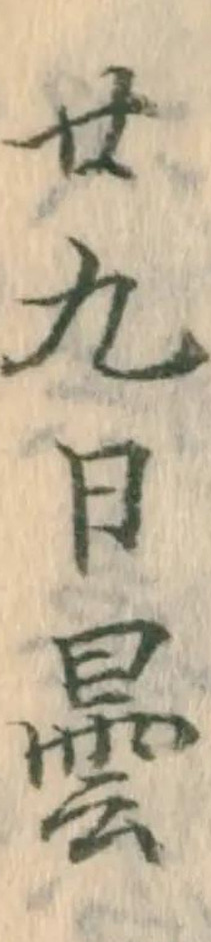廿九日曇
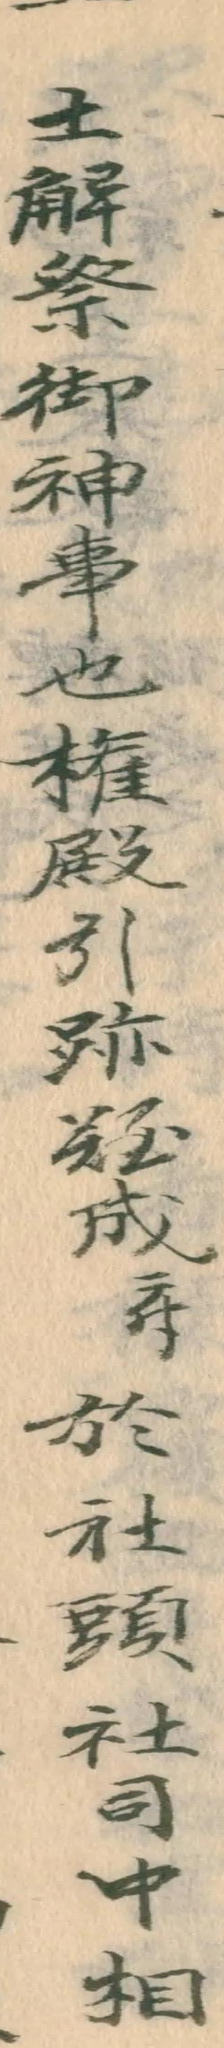一土解祭御神事也権殿引跡難成并於社頭社司中相
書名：賀茂社記録. 第17冊
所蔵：国立国会図書館 National Diet Library, JAPAN
